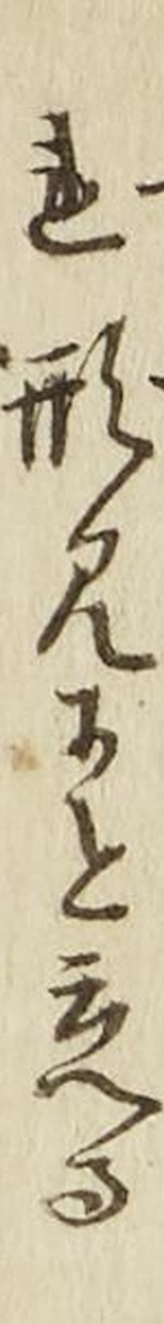れ形見にと云へる
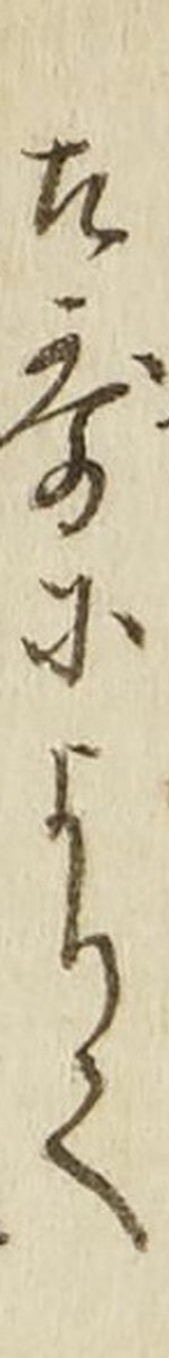古歌によりて
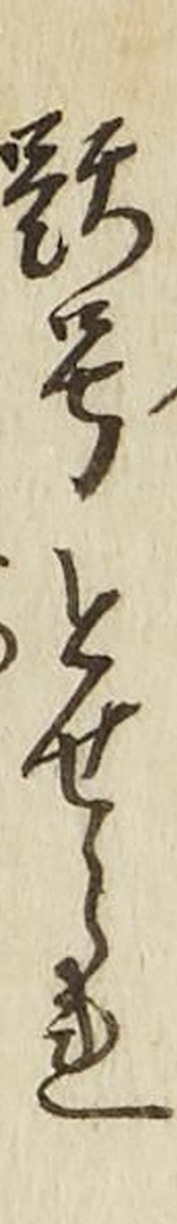題号とせられ
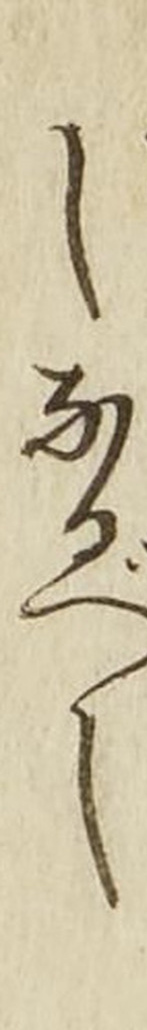しなるべし
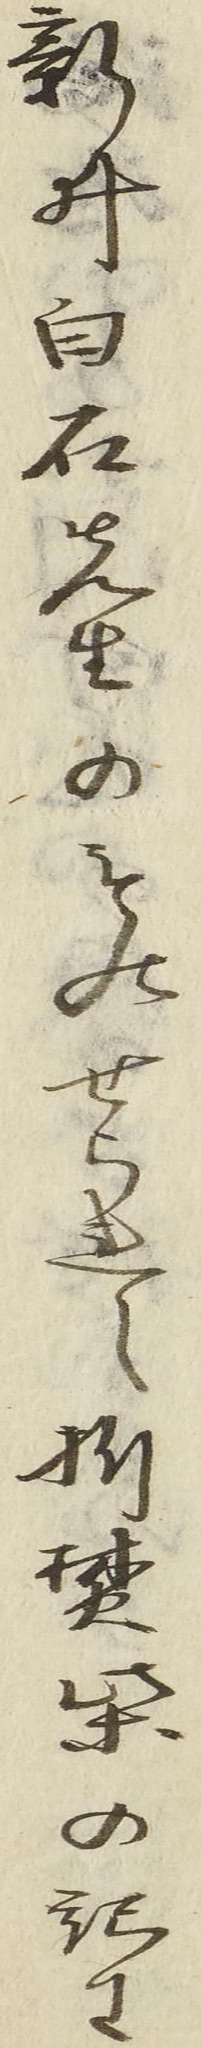新井白石先生のものせられし折焚柴の記に

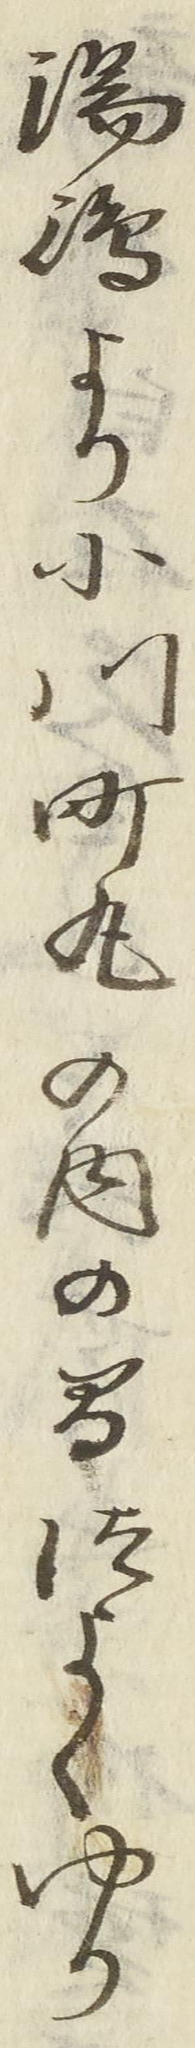湯島より小川町丸の内の間つよくゆり
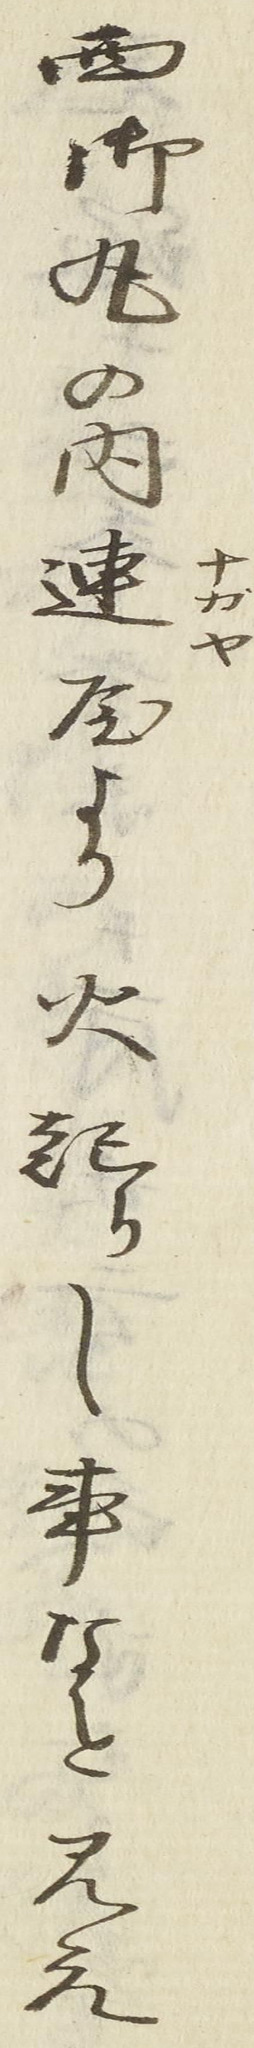西御丸の内連屋より火起りし事なと見え
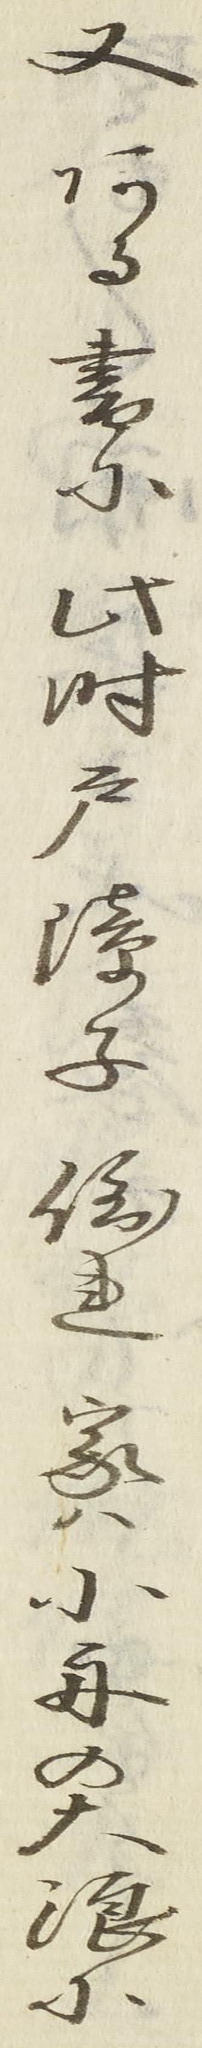又ある書に此時戸障子倒れ家は小舟の大浪に
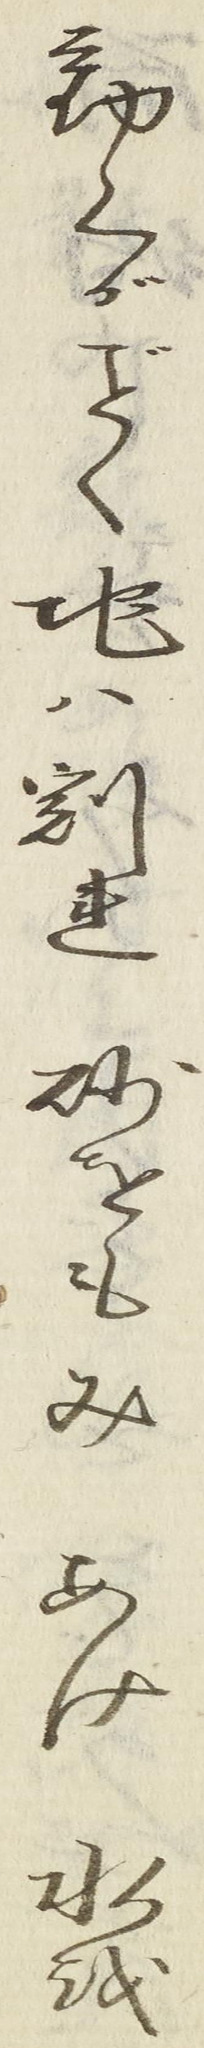動くがごとく地は割れ砂をもみあけ水を
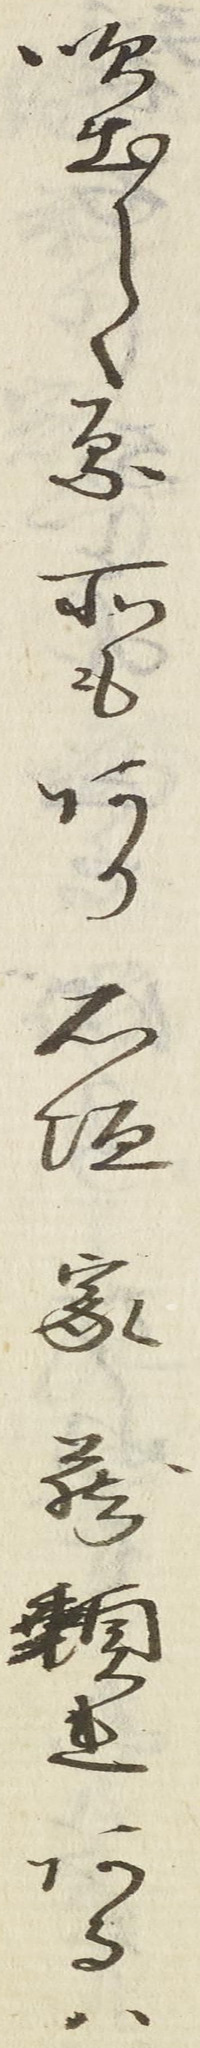吹出したる所もあり石垣家蔵頽れあるは
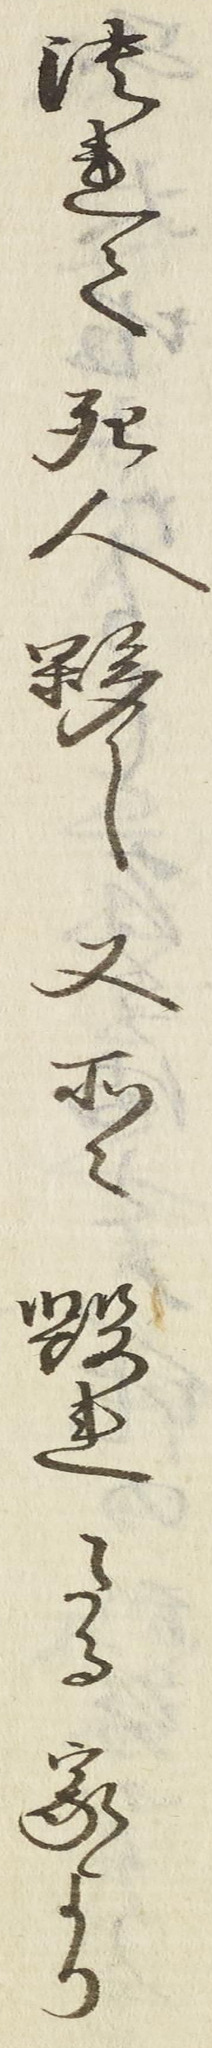潰れて死人夥し又所〻毀れたる家より
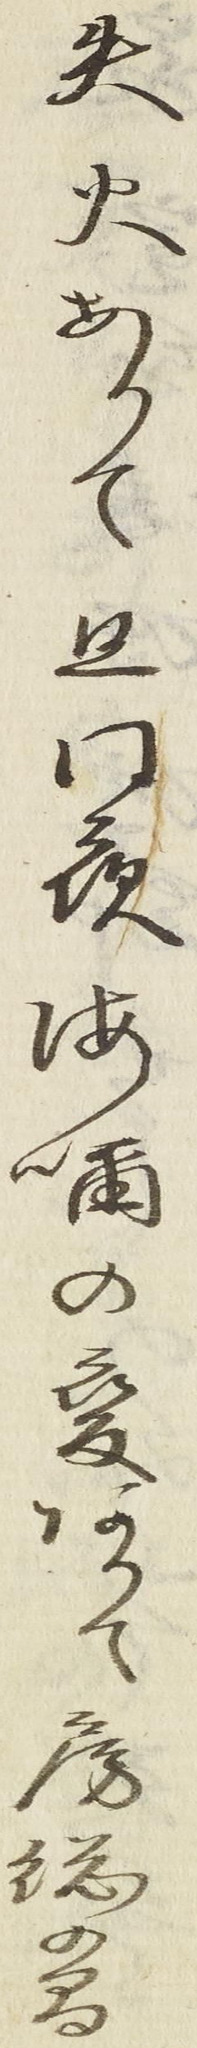失火ありて且同夜海浦の変ありて房総の間
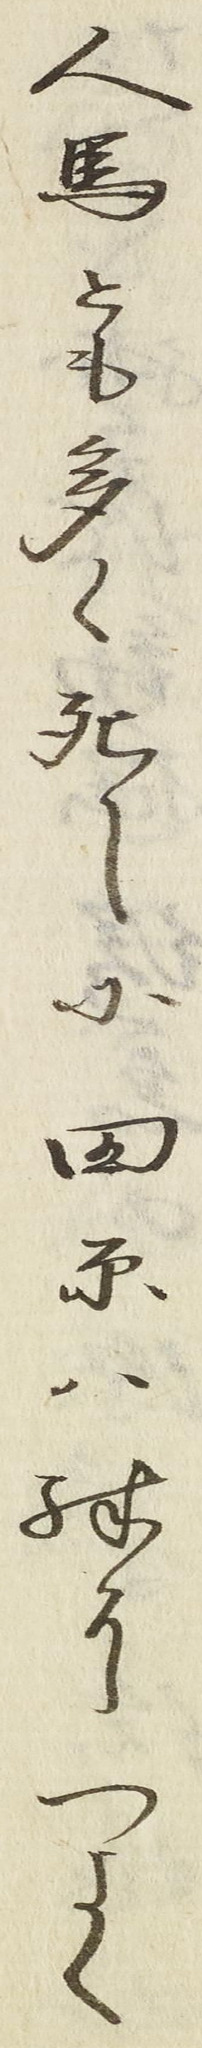人馬とも多く死し小田原は殊につよく
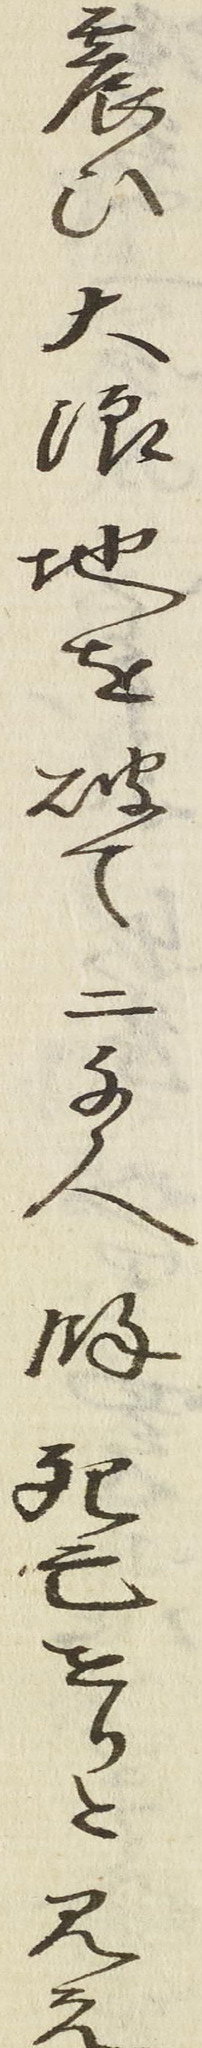震ひ大浪地を破て二千人余死亡せりと見え
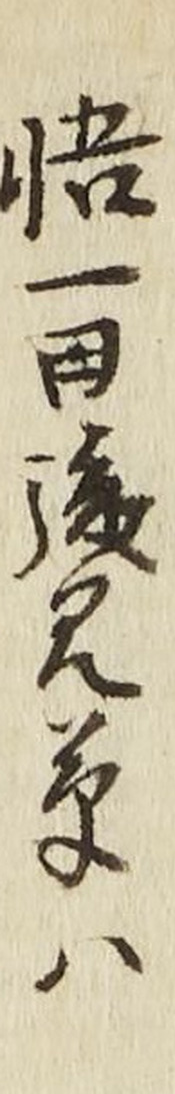悟一曰後見草は
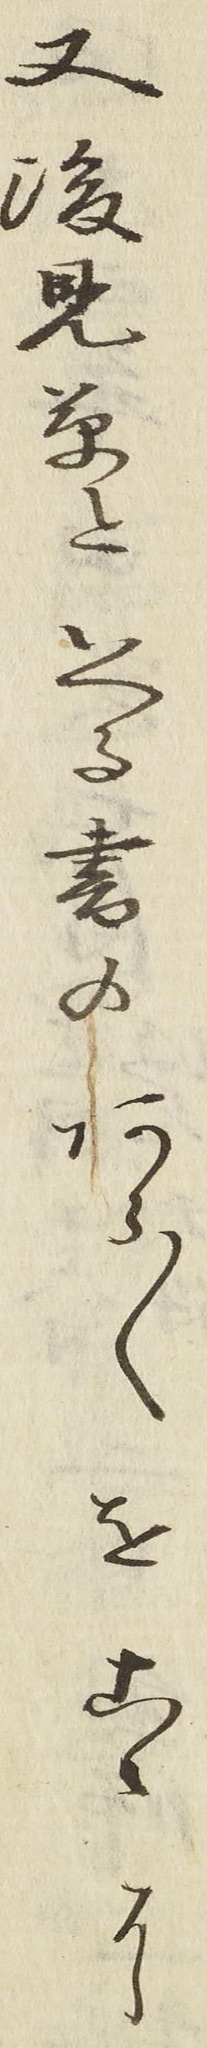又後見草といへる書のあら〳〵をこゝに
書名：やぶれ窓の記　全
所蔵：東京大学地震研究所図書室 Earthquake Research Institute Library, The University of Tokyo, JAPAN
